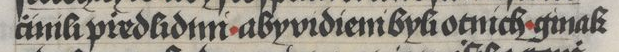ċinili pṙedlidmi.aby vidieni byli otních.ginak
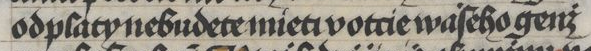odplaty nebudete míeti votcie waẛeho genż
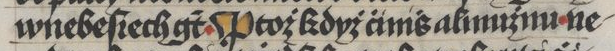wnebeſiech ḡt.Ꝓtoż kdyż ċiniṡ almużnu.ne¬
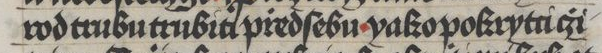rod trubu trubiti pṙedſebu.yako pokryti cżi¬
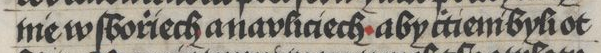níe wſboṙíech a navlicíech.aby ċtiení byli ot¬
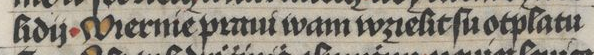lidij.Viernie praui wam wzelitſu otplatu
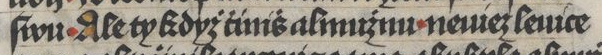ſwu.Ale ty kdyż ċíniš almużnu.neuíeż leuice
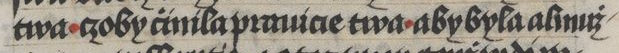twa.czoby ċinila prauicie twa.aby byla almuż¬
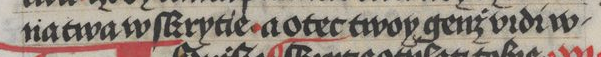na twa wſkrytie.a otec twoy genż vidí w
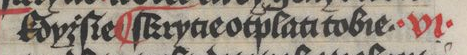kdyż ſie ſkrytie otplati tobie.vi.
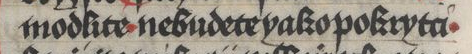modlite.nebudete yako pokrytci.
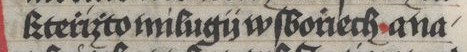kteṙíżto milugij wſboṙiech.a na
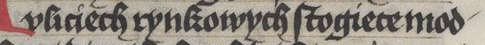vliciech rykowych ſtogiete mod¬
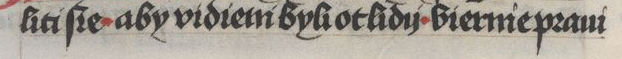liti ſie.aby vidieni byli ot lidij.Viernie praui
